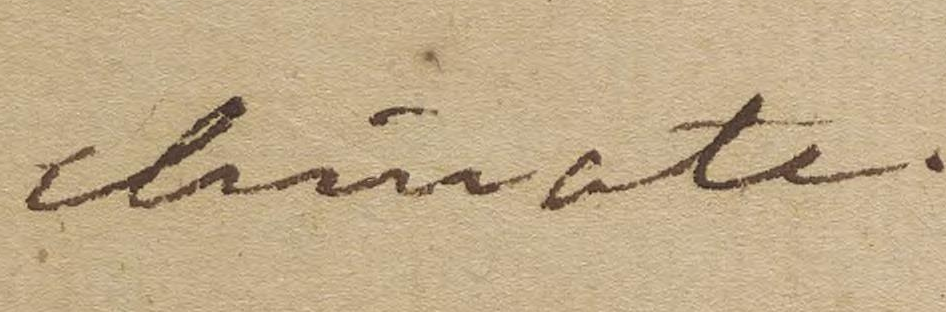climate.
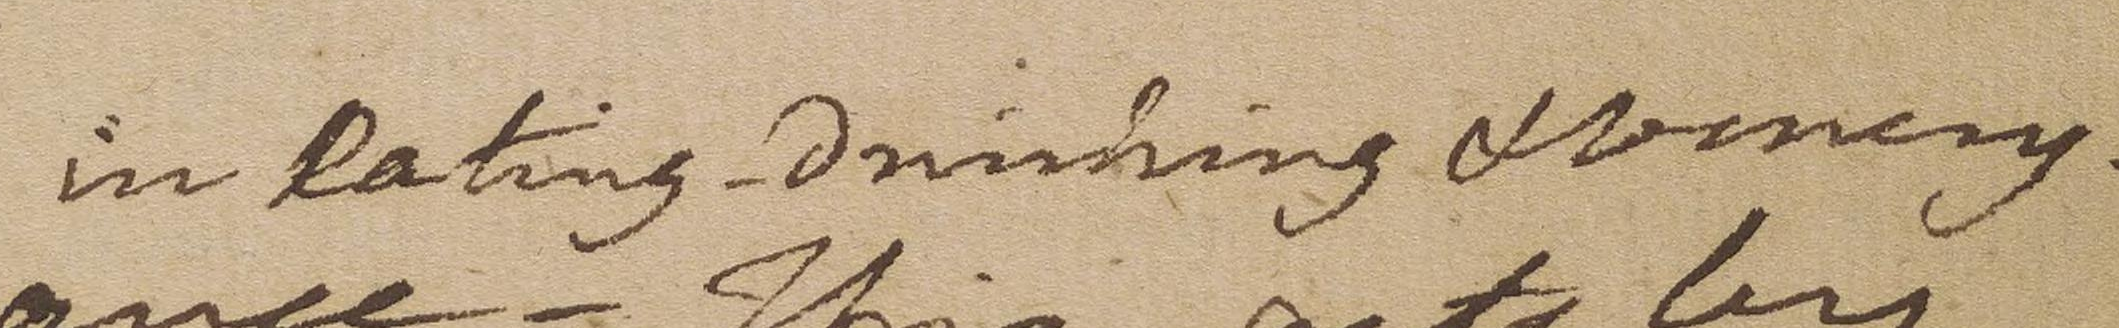in Rating, drinking, & money
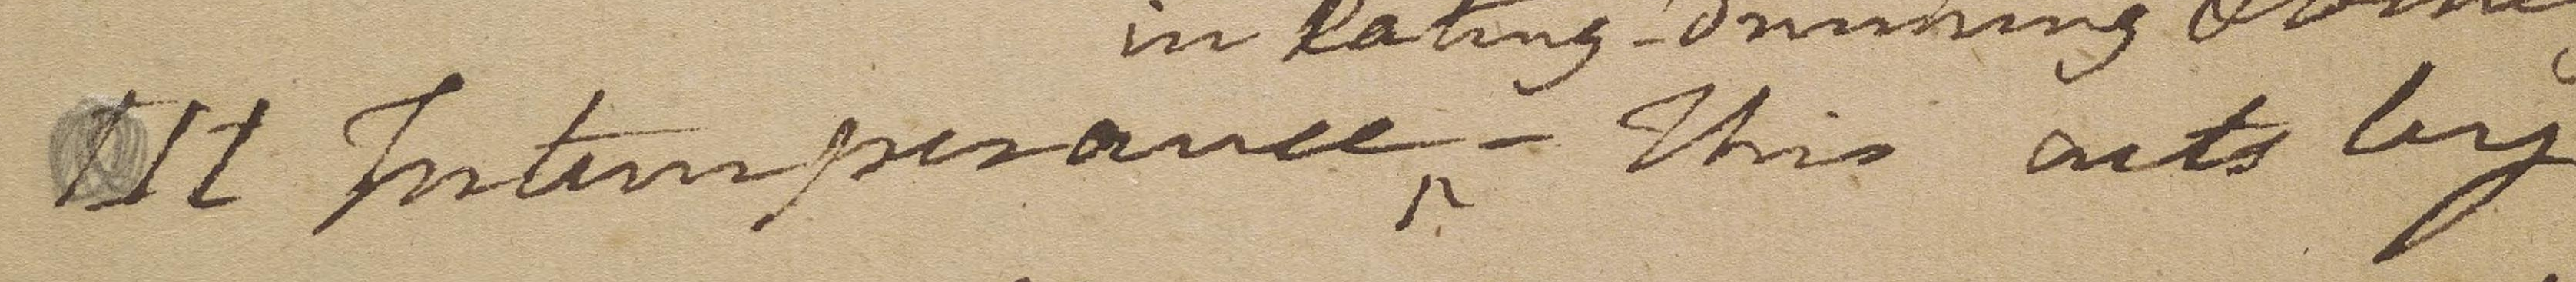III Intemperance ^ This acts by
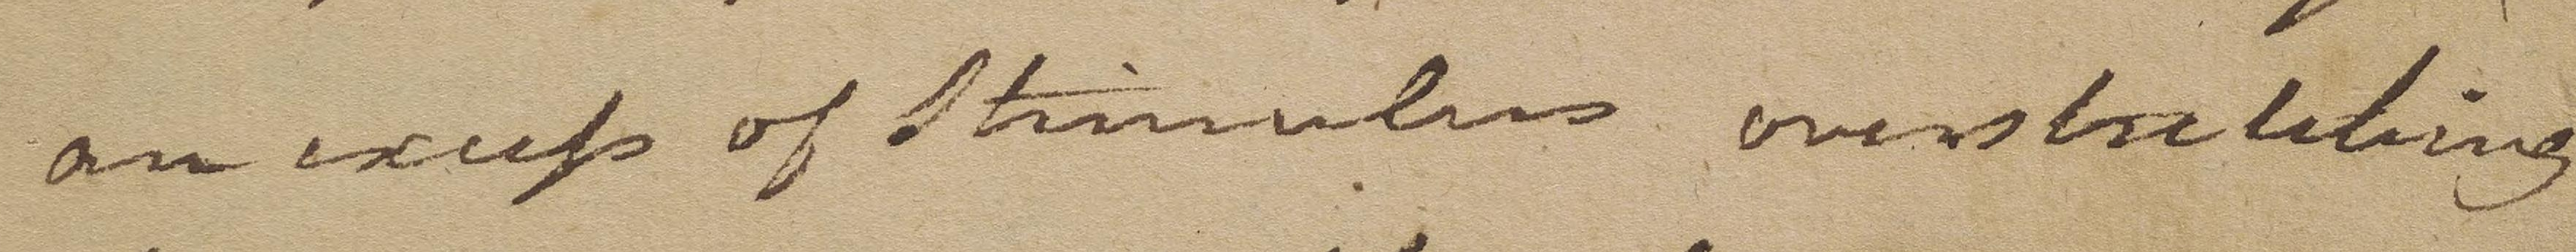an excess of stimulus overstressing
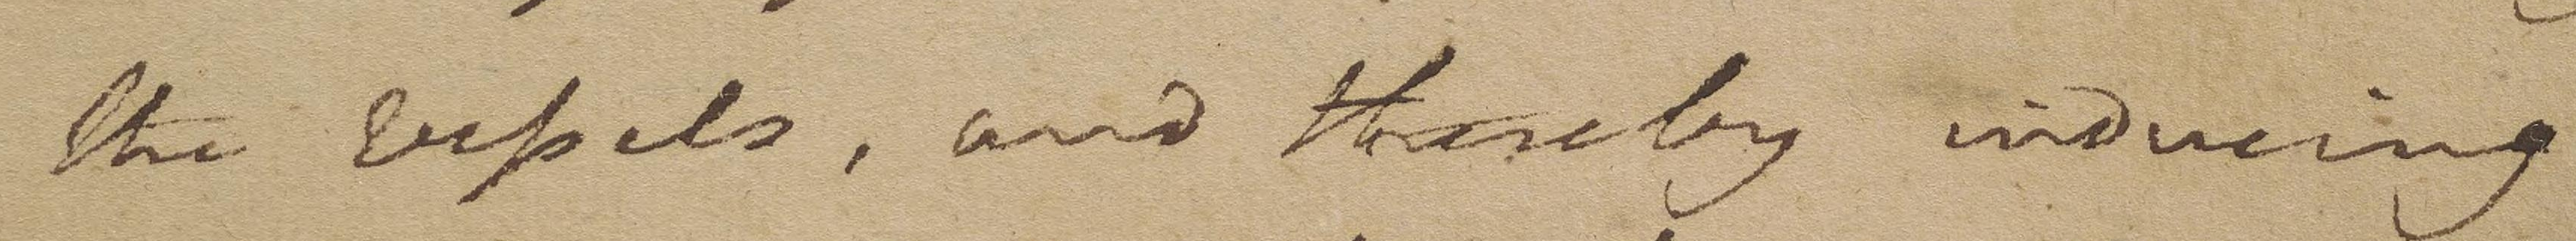the excess, and thereby inducing
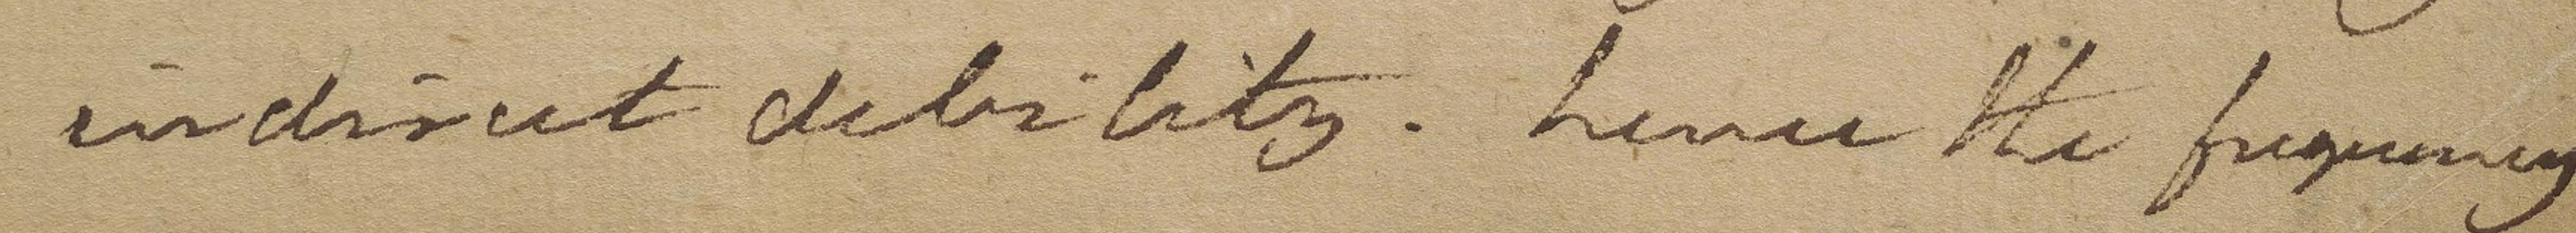indirect debility. Hence the frequency
